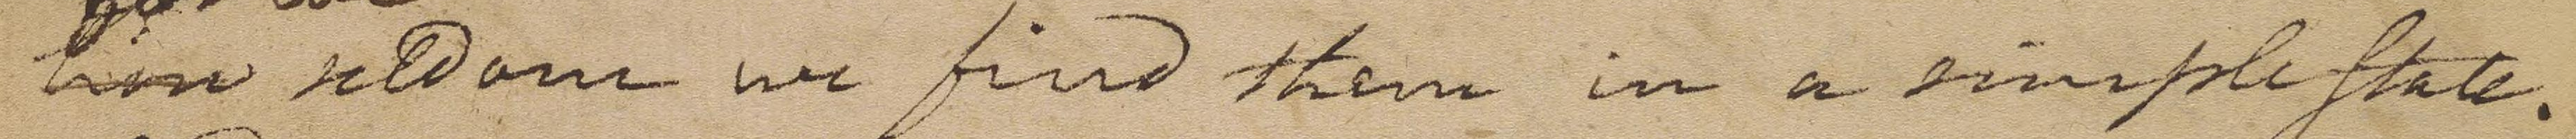[how] seldom we find them in a simple state
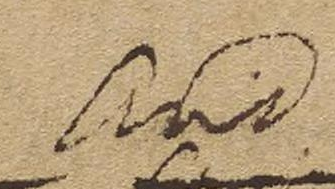and
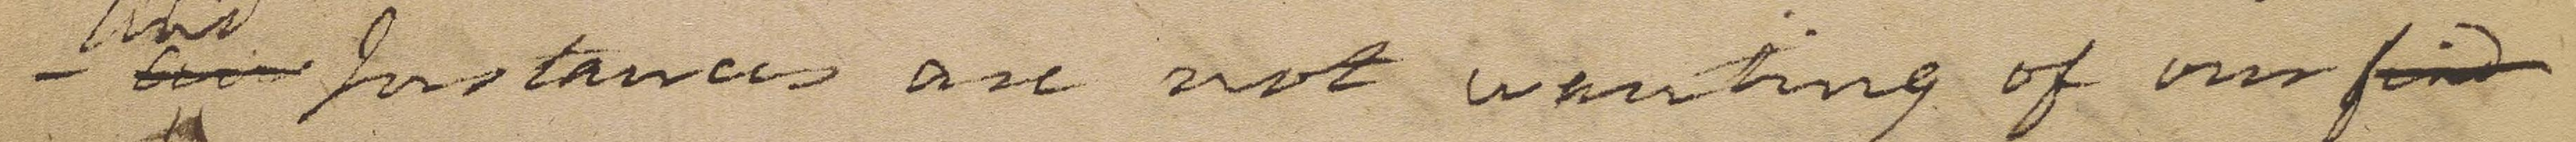- [are] Instances are not wanting of our [find]
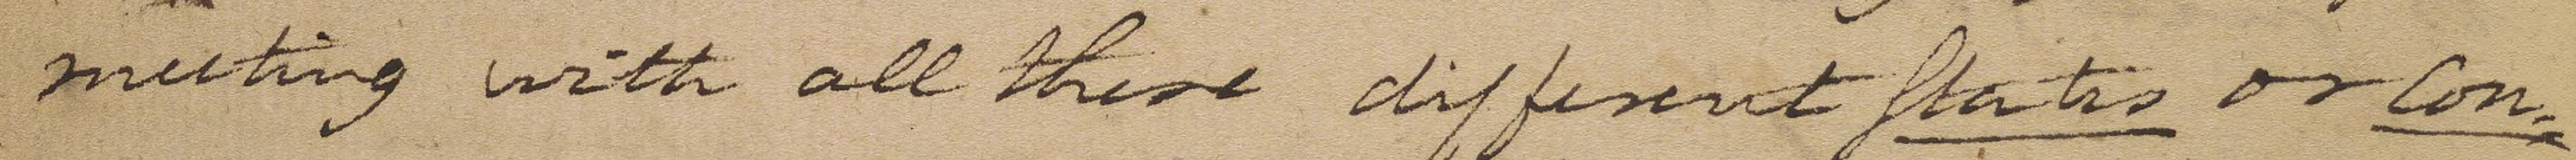meeting with all these different states or con-
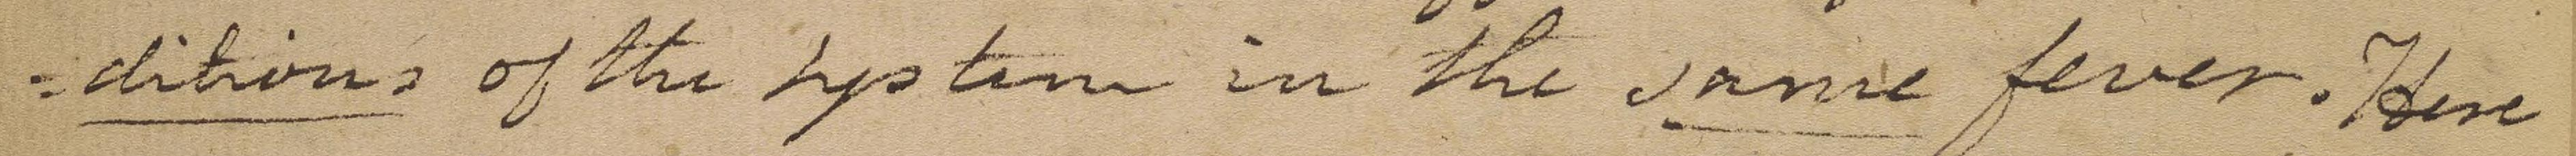-ditions of the system in the same fever. Here
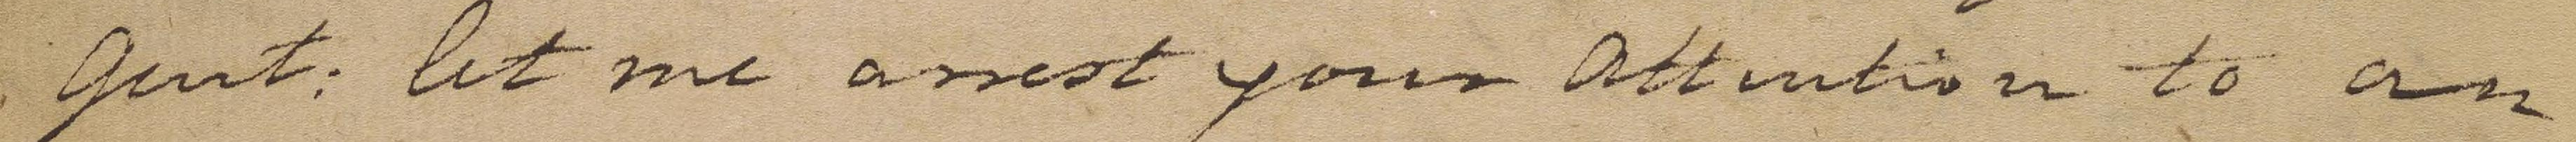Gent: let me arrest your attention to an
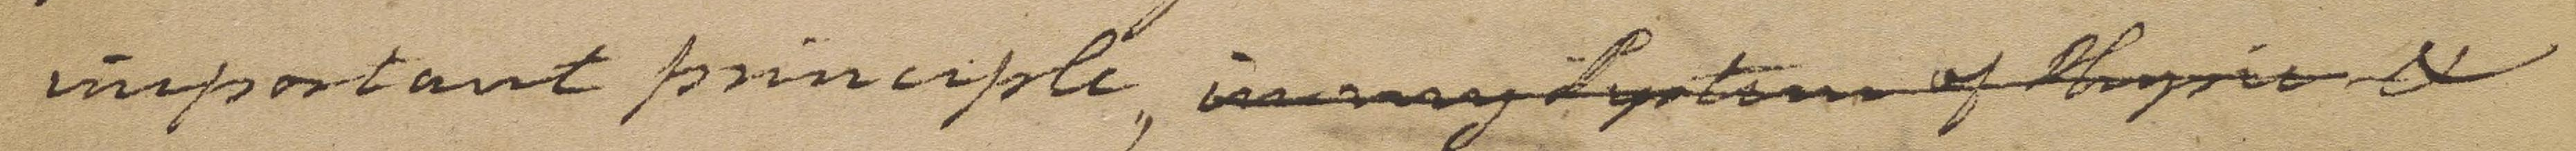important principle, [in my system of Physic] &
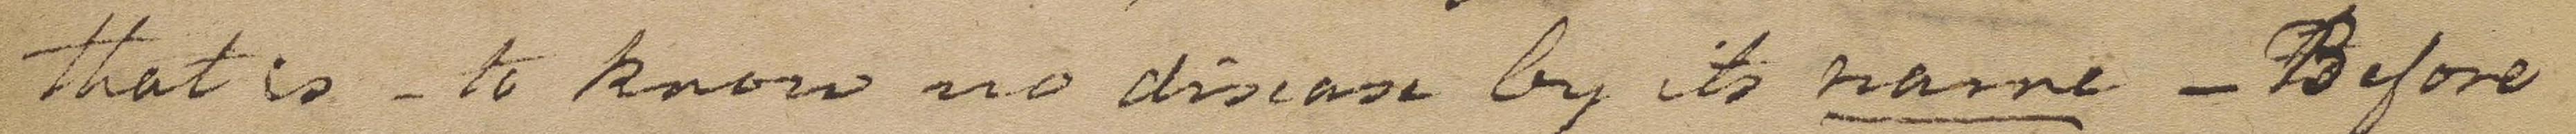that is to know no disease by its name. Before
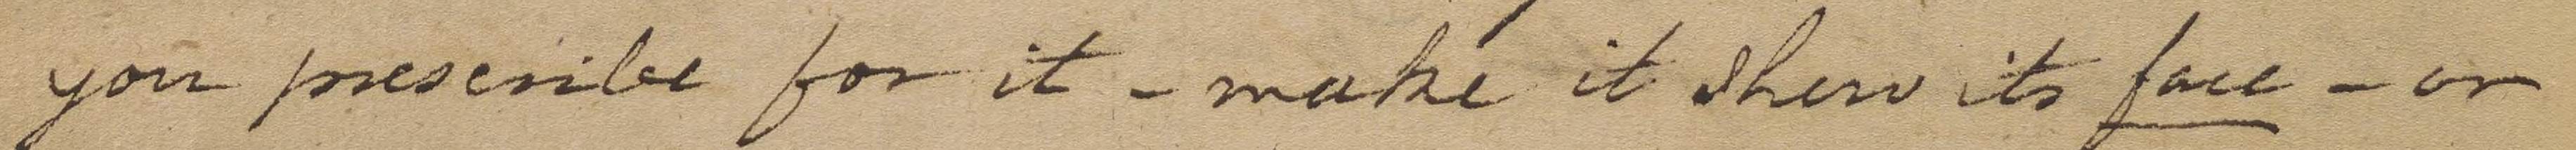you prescribe for it, make it shew its face, or
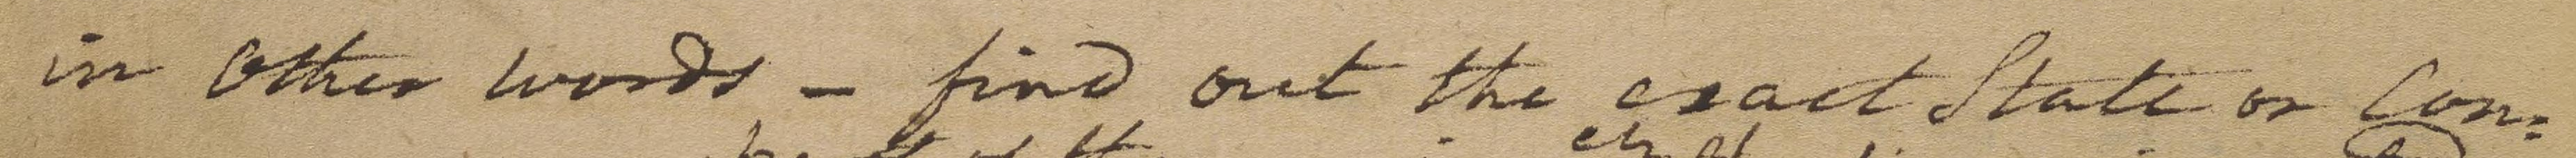in other words- find out the exact state or con-
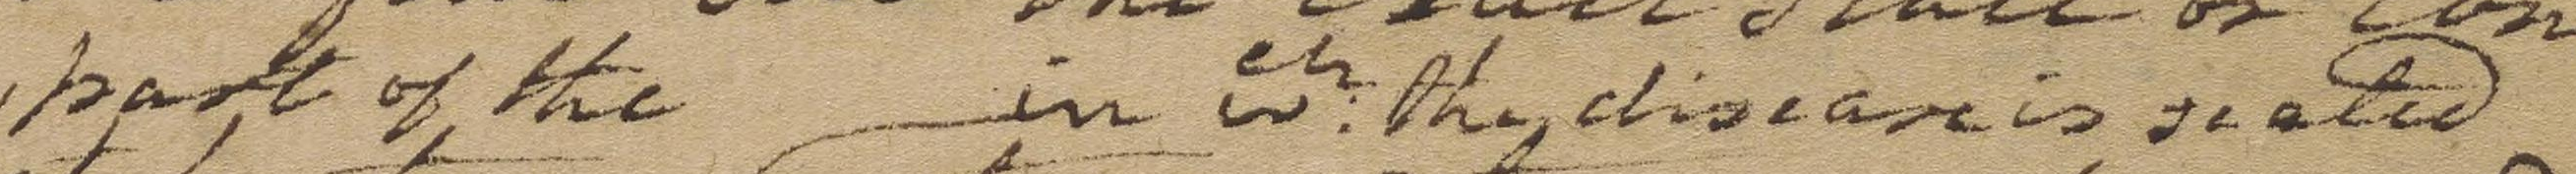part of the in w^ch the disease is seated
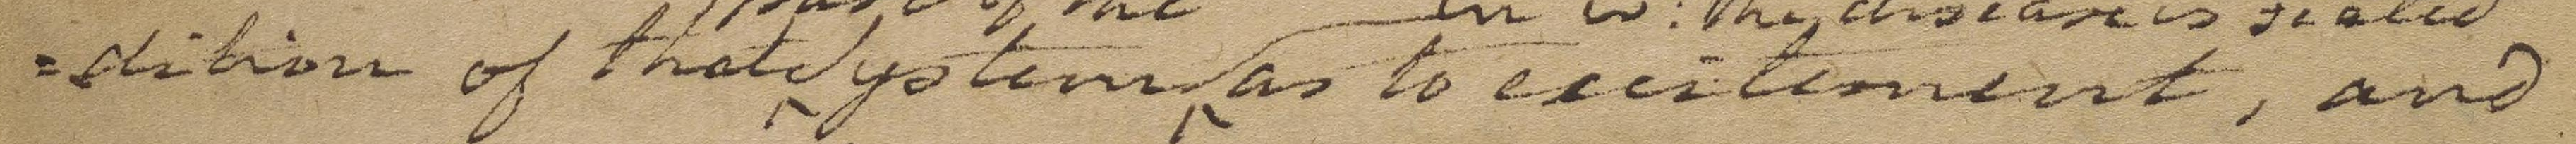-dition of that ^ system ^ as to excitement, and
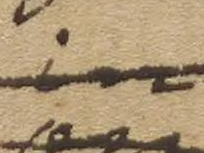in
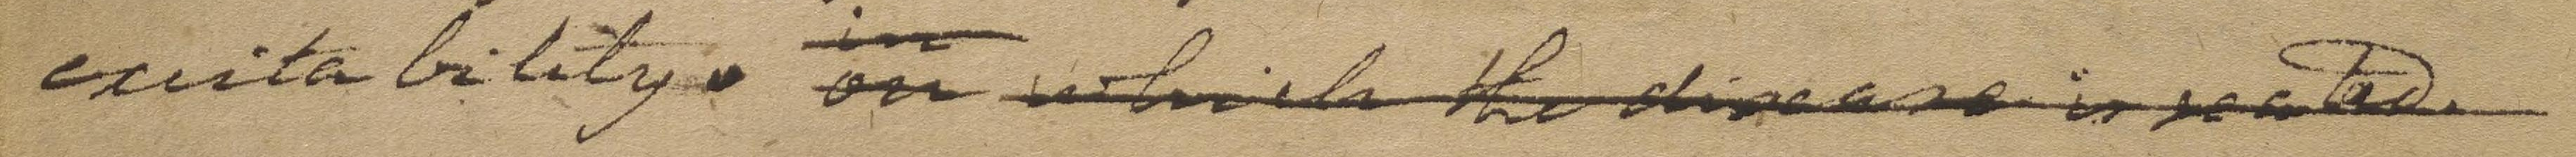excitability [on which the disease is seated]
